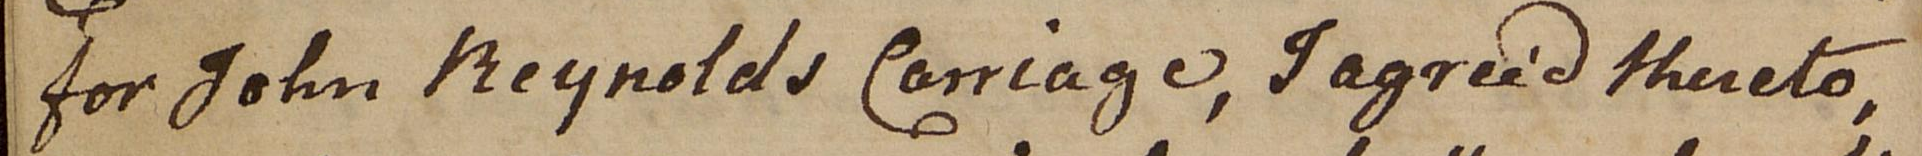for John Reynolds Carriage, I agree'd thereto,
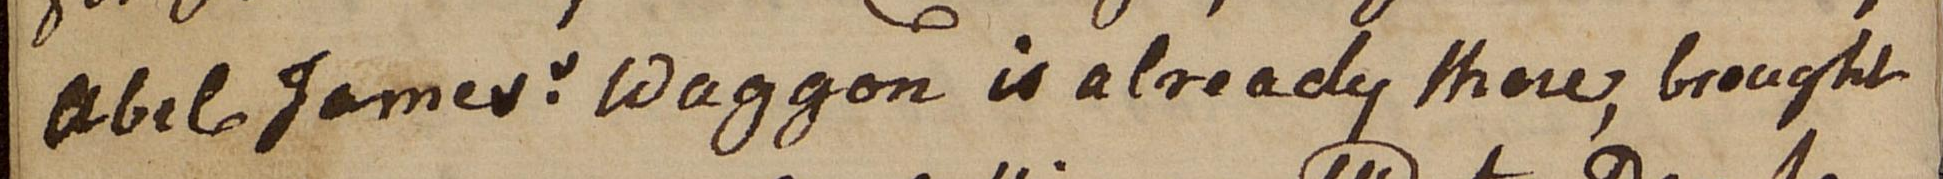Abel James^s. Waggon is already there, brought
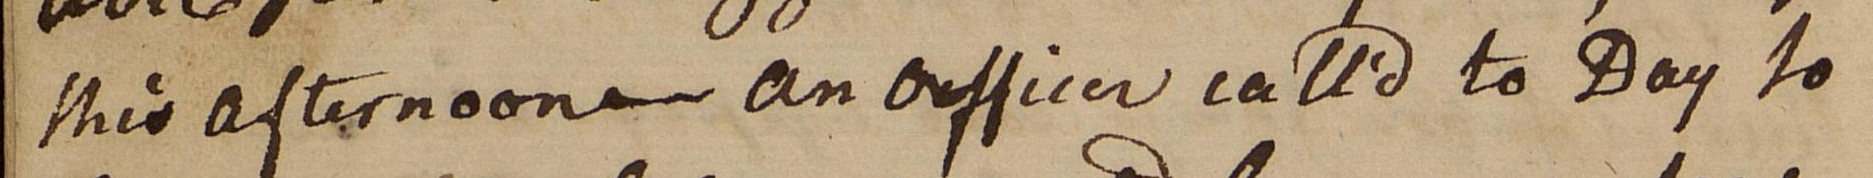this Afternoon- An Officer call'd to Day to
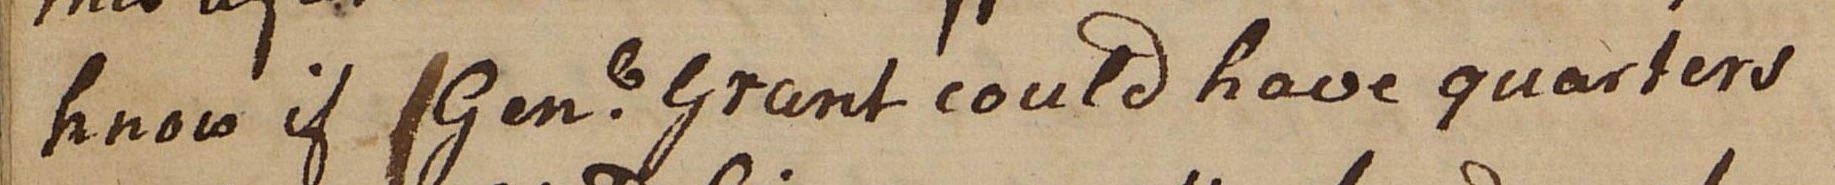know if Gen^l. Grant could have quarters
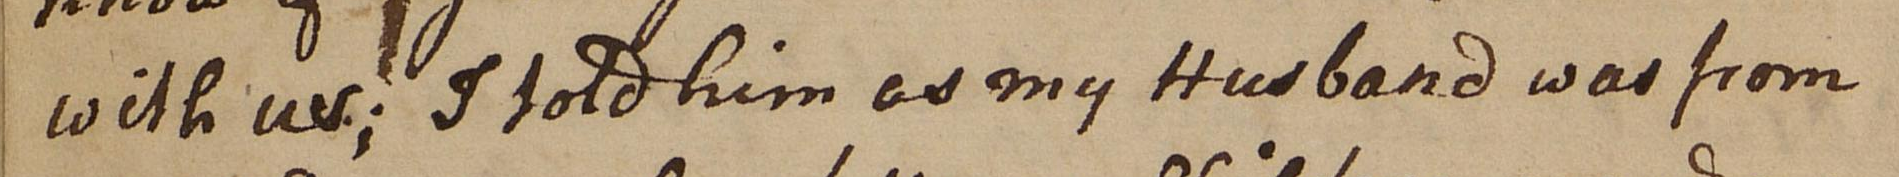with us; I told him as my Husband was from
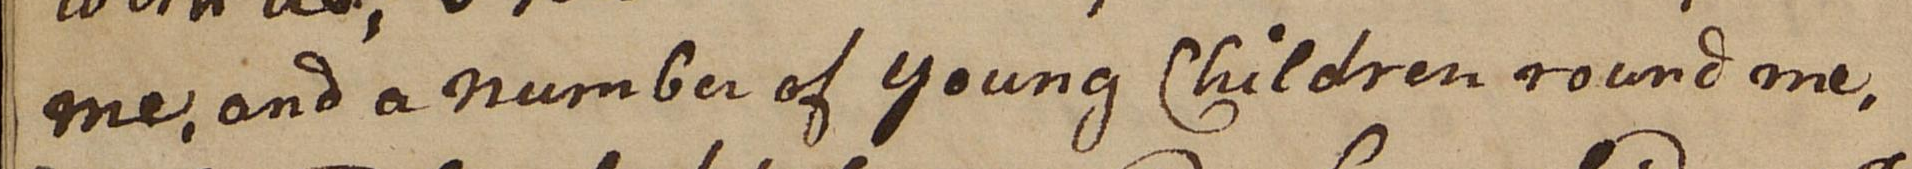me and a number of Young Children round me,
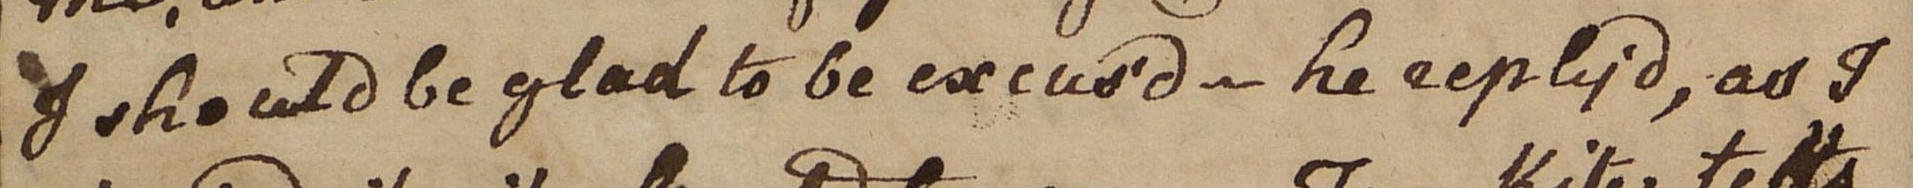I should be glad to be excus'd- he reply'd, as I
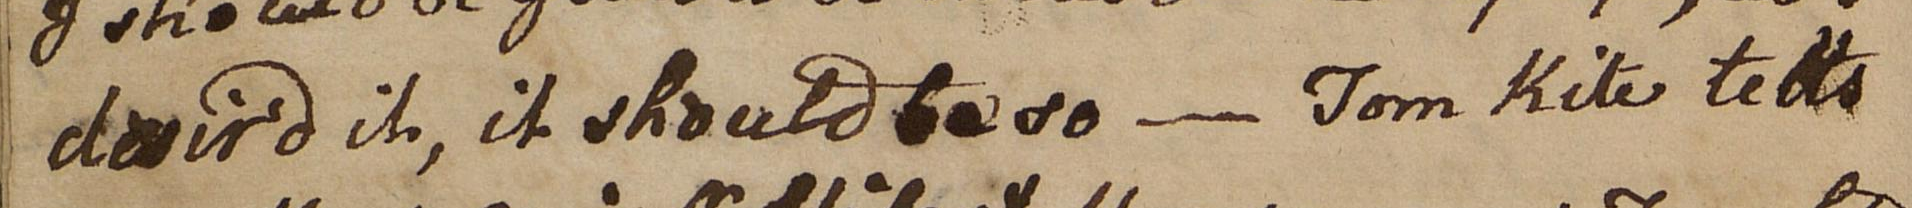desir'd it, it should be so- Tom Kite tells
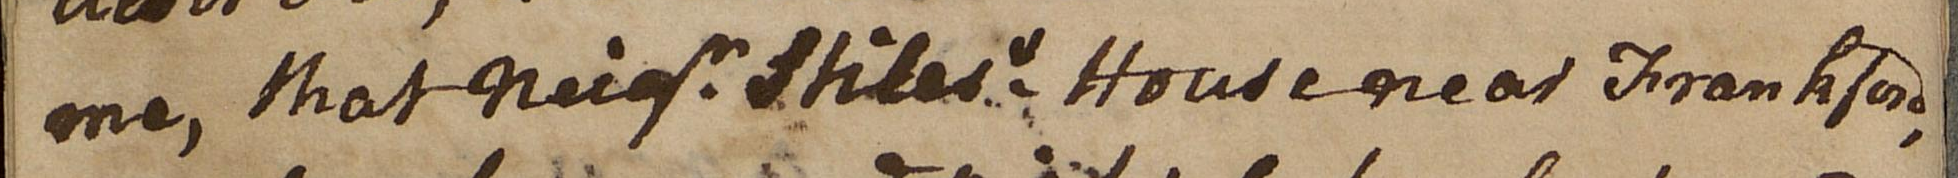me, that Neigh^r. Stiles^s. House near Frankford,
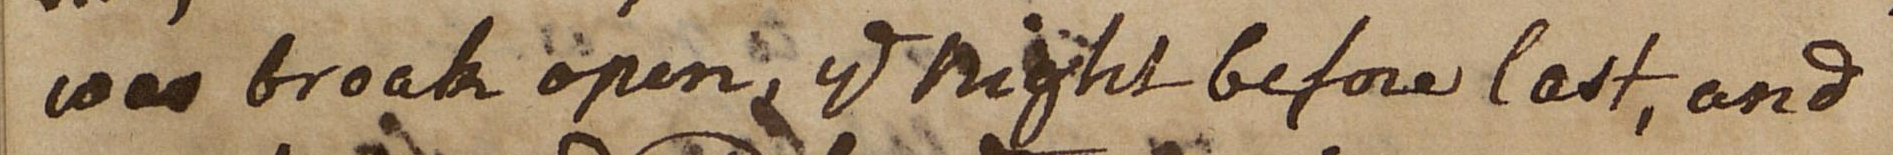was broak open, y^e night before last, and
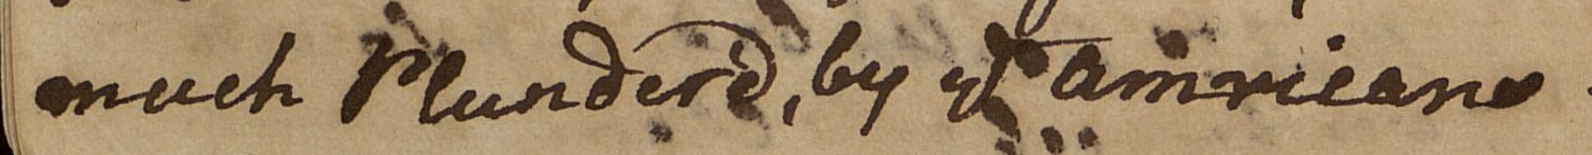much Plunder'd, by y^e Amricans -
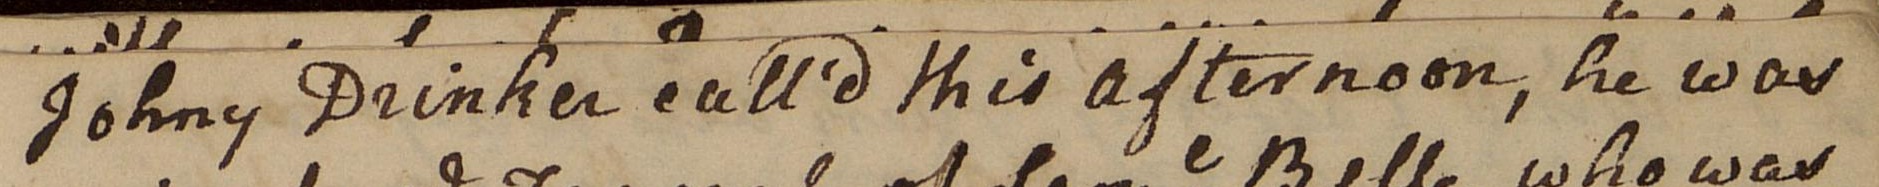Johny Drinker call'd this afternoon, he was
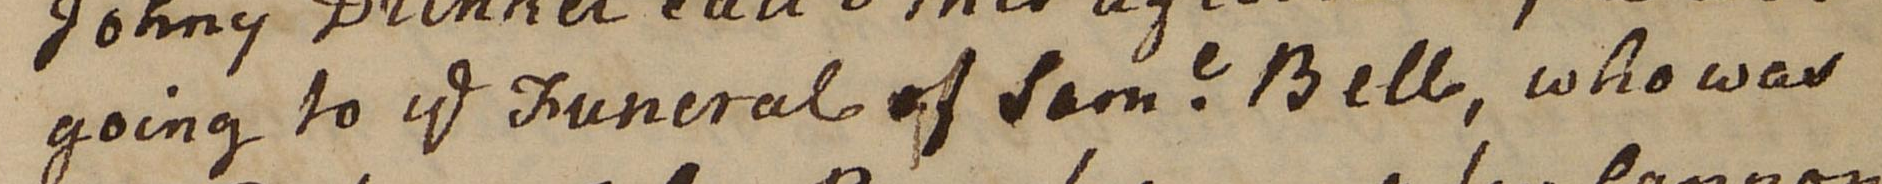going to y^e Funeral of Sam^l. Bell, who was
